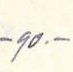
90
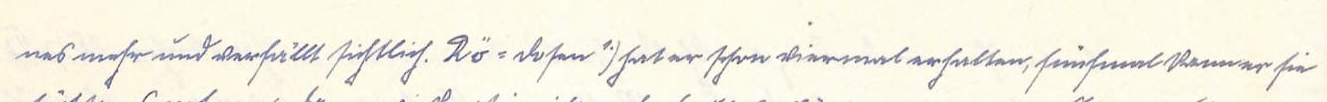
nes mehr und verfällt sichtlich. Re-Dosen 1) hat er schon viermal erhalten, fünfmal kann er sie
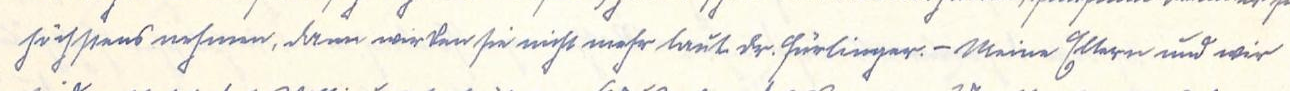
höchstens nehmen. Dann wirken sie nicht mehr laut Dr. Fürlinger. Meine Eltern und wir
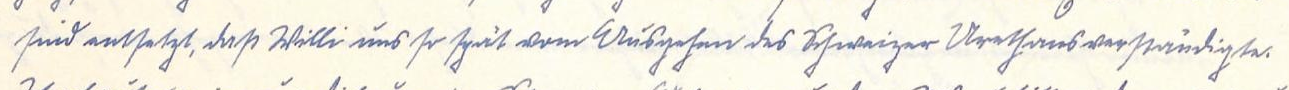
sind entsetzt, dass Willie uns so spät vom Ausgehen des Schweizer Urethans verständigte
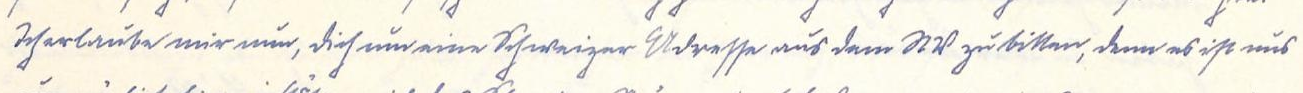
Ichmerlaube mir nun, dich um eine Schweizer Adresse aus dem CV zu bitten, denn es ist uns
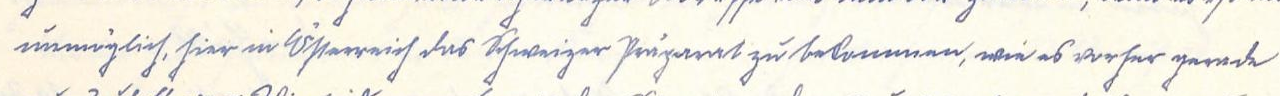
unmöglich, hier in Österreich das Schweizer Präparat zu bekomnmen, wie es vorher gerade
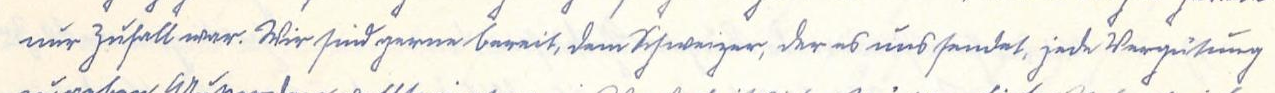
nur Zufall war. Wir sind gerne bereit, dem Schweizer, der es uns sendet, jede Vergütung
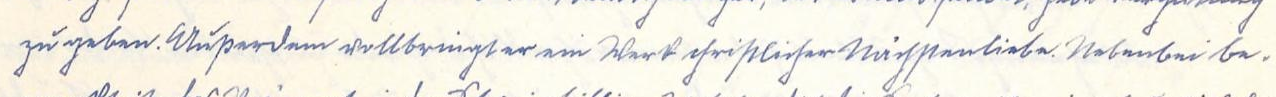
zu geben. Außerdem vollbringt er ein Werk christlicher Nächstenliebe. Nebenbei be-
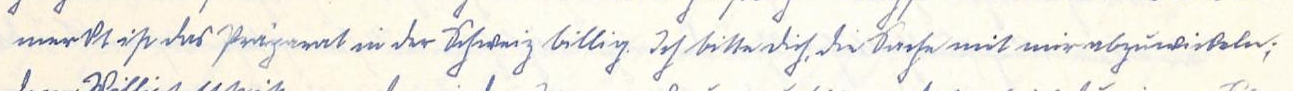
merkt ist das Präparat in der Schweiz billig. Ich bitte dich, die Sache mit mir abzuwickeln,
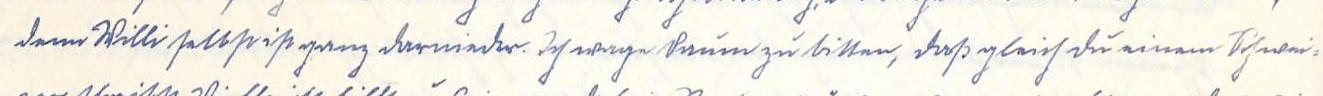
denn Willi selbst ist ganz darnieder. Ich wage kaum zu bitten, daß gleich du einem Schwei-
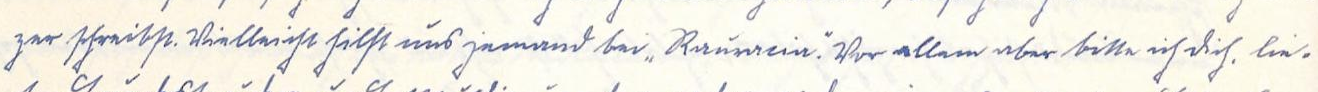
zer schreibst. Vielleicht hilft uns jemand bei „Rauracia“. Vor allen aber bitte ich dich, lie-
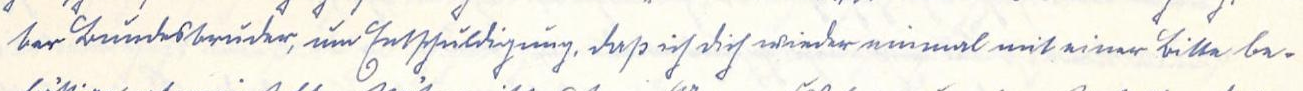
ber Bundesbruder, um Entschuldigung, dass ich dich wieder einmal mit einer Bitte be-
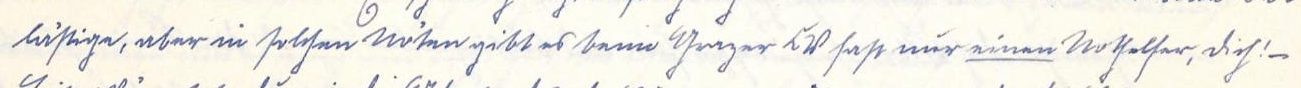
lästige, aber in solchen Nöten gibt es beim Grazer CV fast nur einen Nothelfer, Dich!
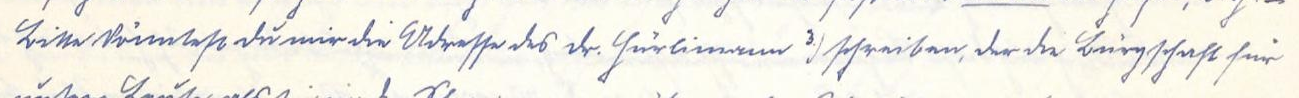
Bitte könntest du mir die Adresse des Dr. Hürlimann 3) schreiben, der die Bürgschaft für
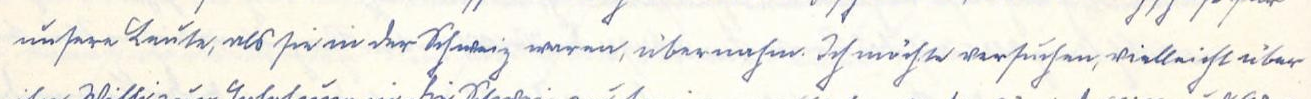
unsere Leute, als sie in der Schweiz waren, übernahm. Ich möchte versuchen, vielleicht über
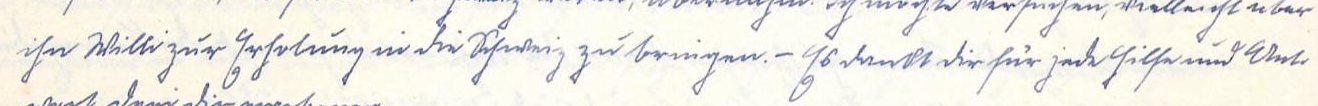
ihn Willi zur Erholung in die Schweiz zu bringen.- Es dankt Dir für jede Hilfe und Ant-
